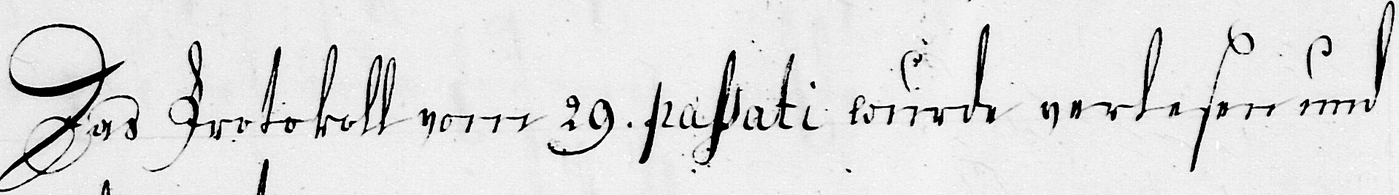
Das Protokoll vom 29. paßati wurde verlesen und
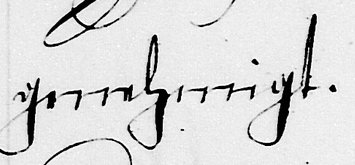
genehmigt.
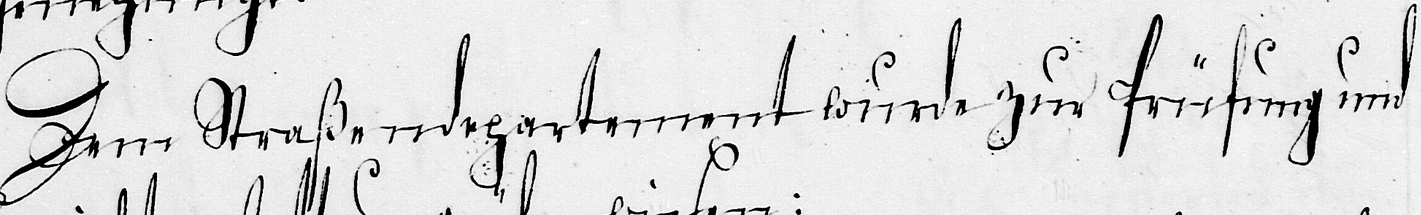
Dem Straßendepartement wurde zur Prüfung und
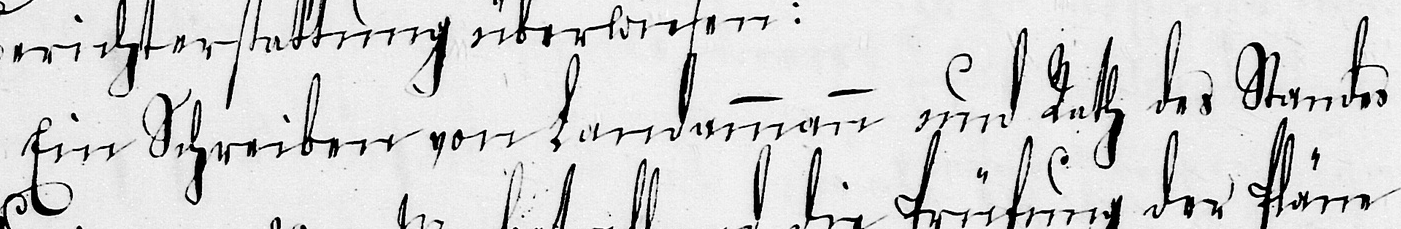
Ein Schreiben von Landammann und Rath des Standes
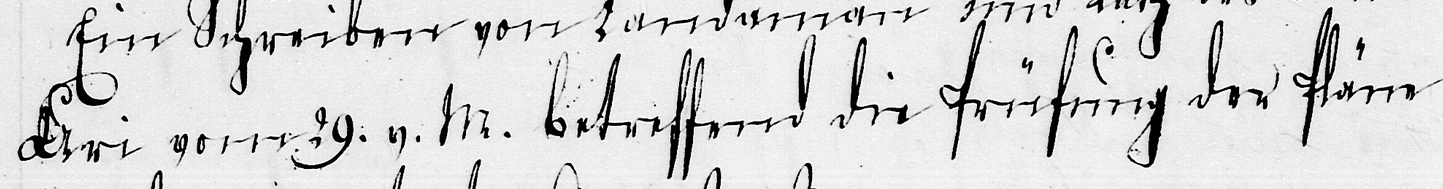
Uri vom 29. v. M. betreffend die Prüfung der Pläne
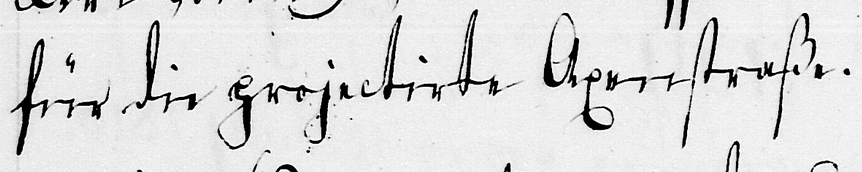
für die projectirte Axenstraße.
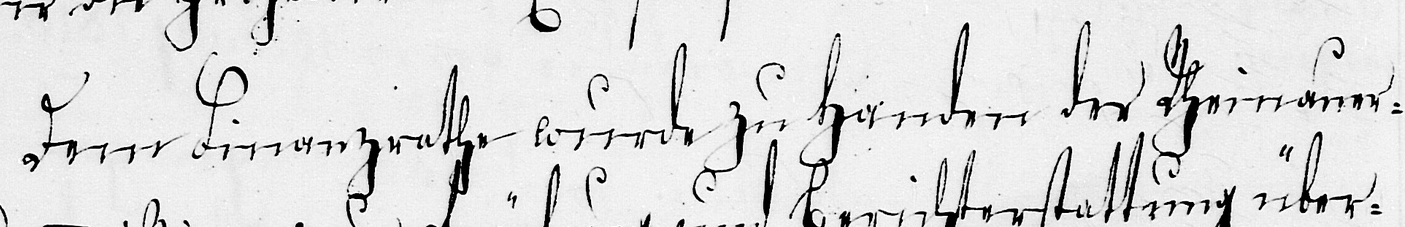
Dem Finanzrathe wurde zu Handen der Rheinaue¬
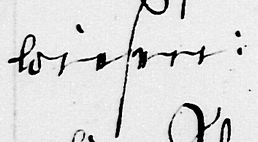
wiesen:
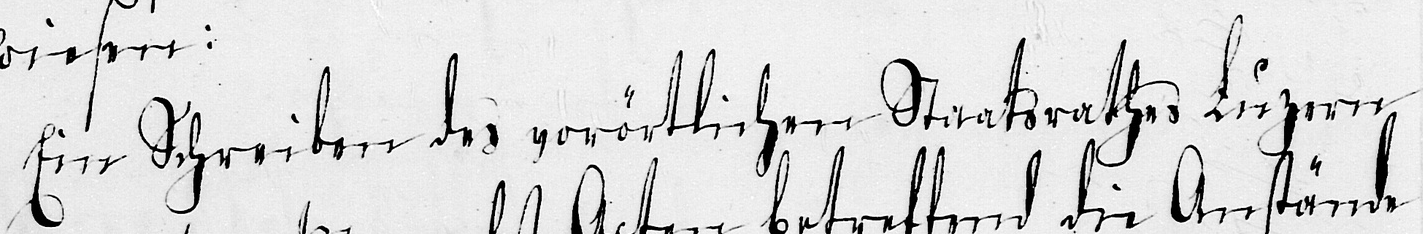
Ein Schreiben des vorörtlichen Staatsrathes Luzern
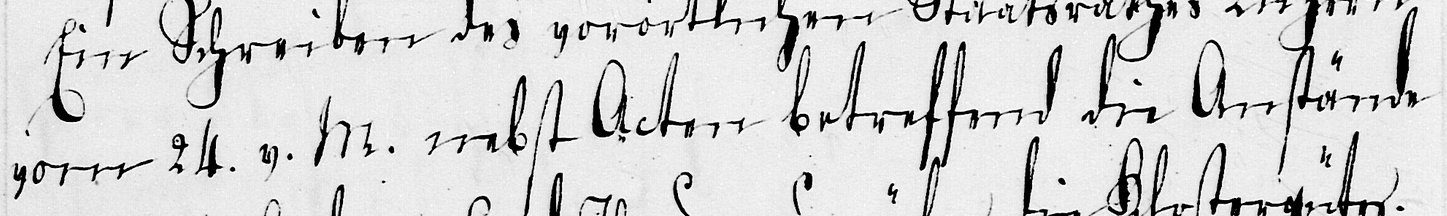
vom 24. v. M. nebst Acten betreffend die Anstände
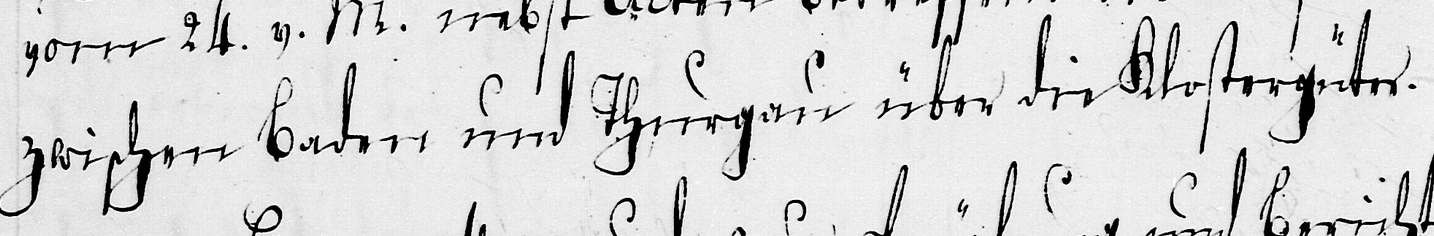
zwischen Baden und Thurgau über die Klostergüter.
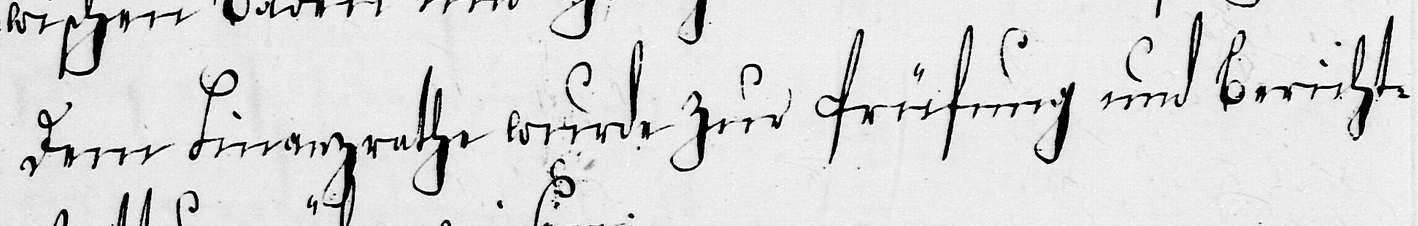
Dem Finanzrathe wurde zur Prüfung und Bericht¬
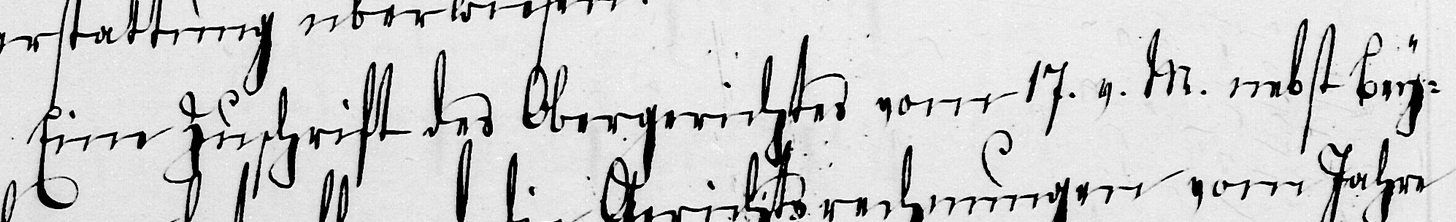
Eine Zuschrift des Obergerichtes vom 17. v. M. nebst Bey¬
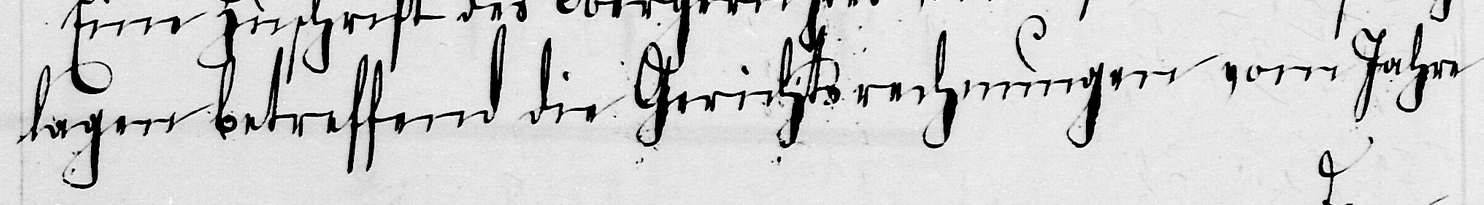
lagen betreffend die Gerichtsrechnungen vom Jahre
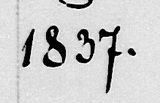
1837.
